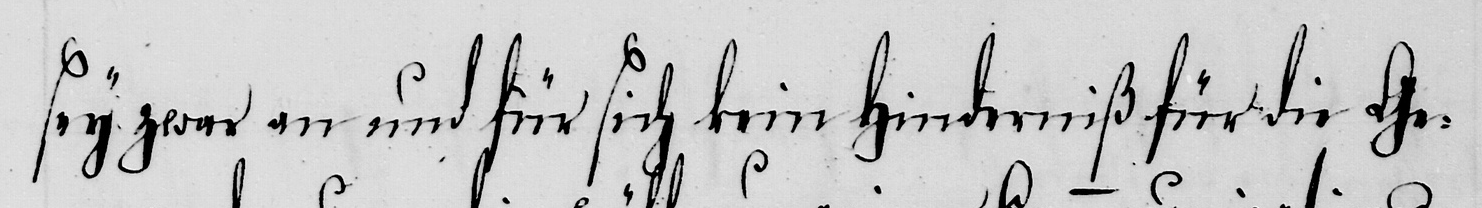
sey zwar an und für sich kein Hinderniß für die Ge¬
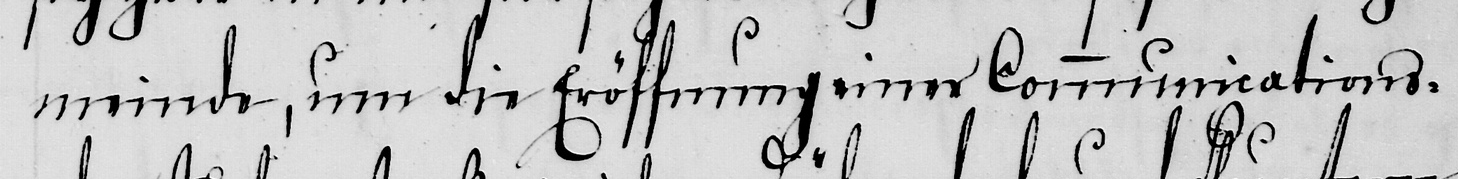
meinde, um die Eröffnung einer Communications-
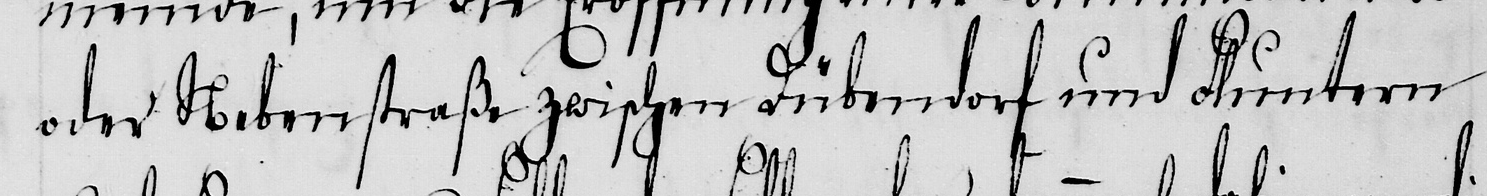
oder Nebenstraße zwischen Dübendorf und Fluntern
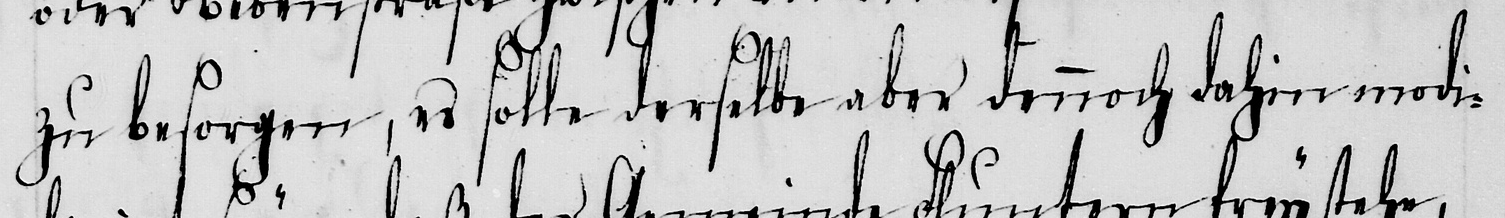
zu besorgen, es solle derselbe aber dennoch dahin modi¬
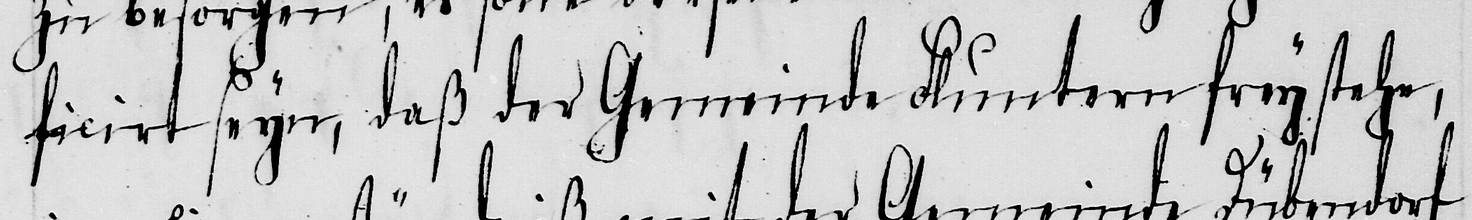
ficirt seyn, daß der Gemeinde Fluntern frey stehe,
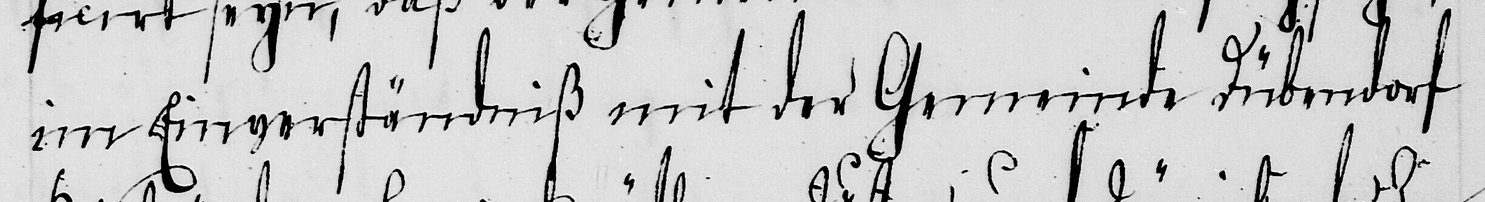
im Einverständniß mit der Gemeinde Dübendorf
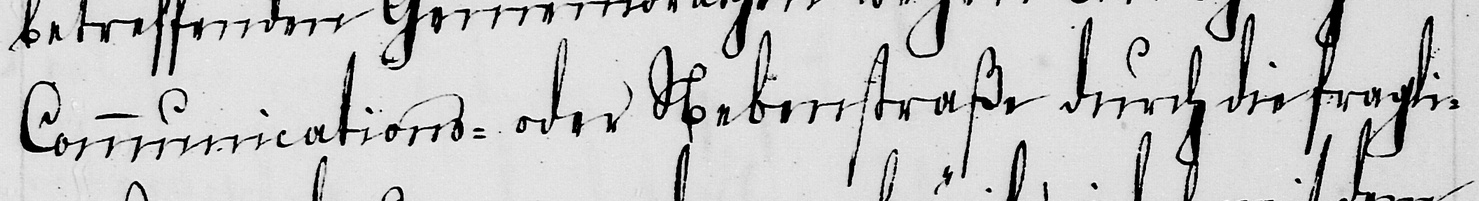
Communications- oder Nebenstraße durch die fragli¬
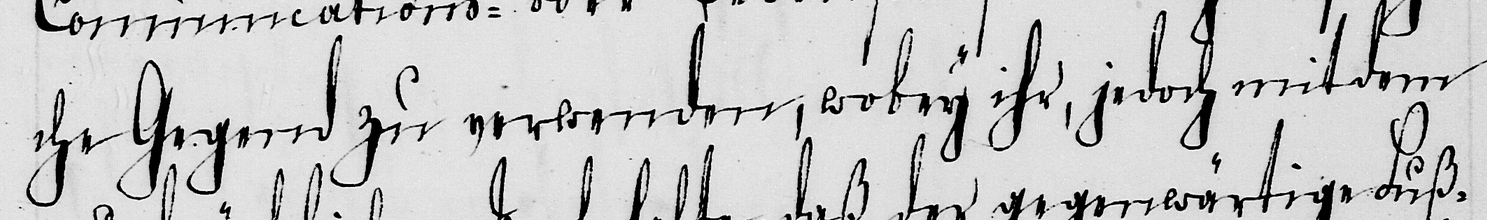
che Gegend zu verwenden, wobey ihr, jedoch mit dem
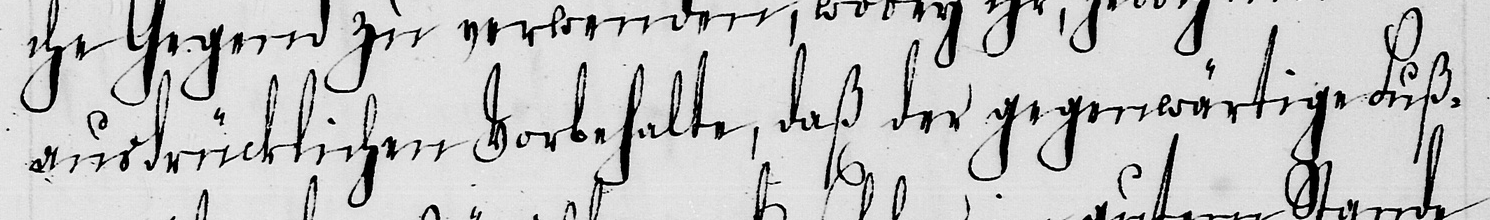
ausdrücklichen Vorbehalte, daß der gegenwärtige Fuß¬
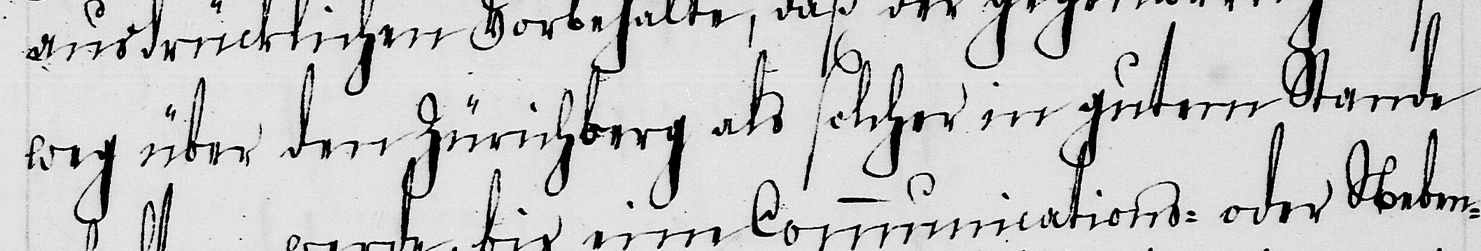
weg über den Zürichberg als solcher in gutem Stande
